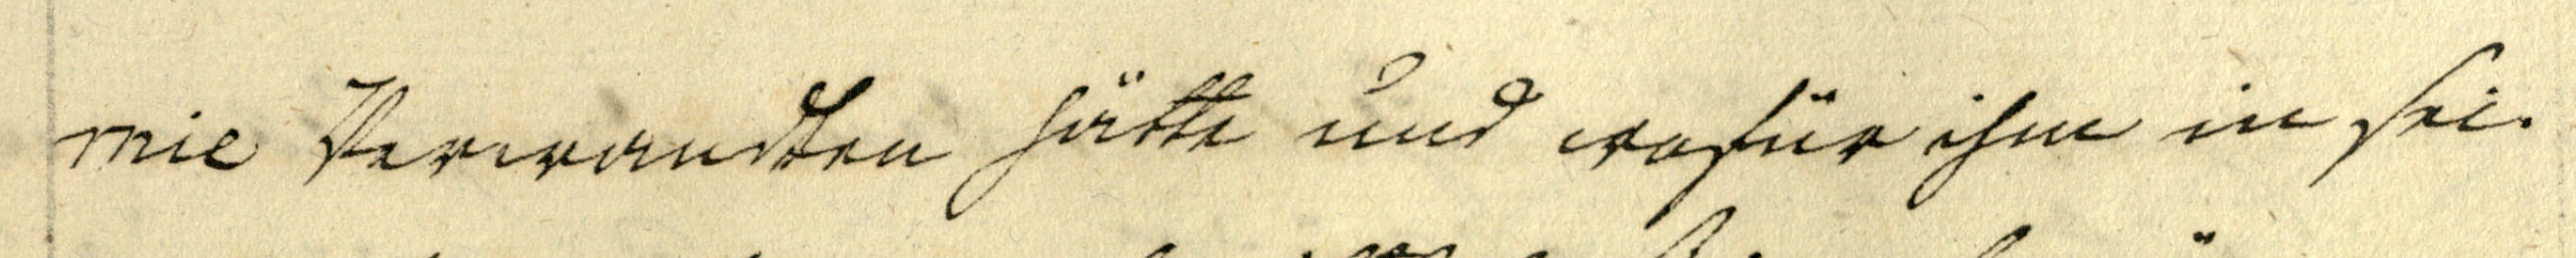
mie Verwandten hätte und wofür ihm im sei¬
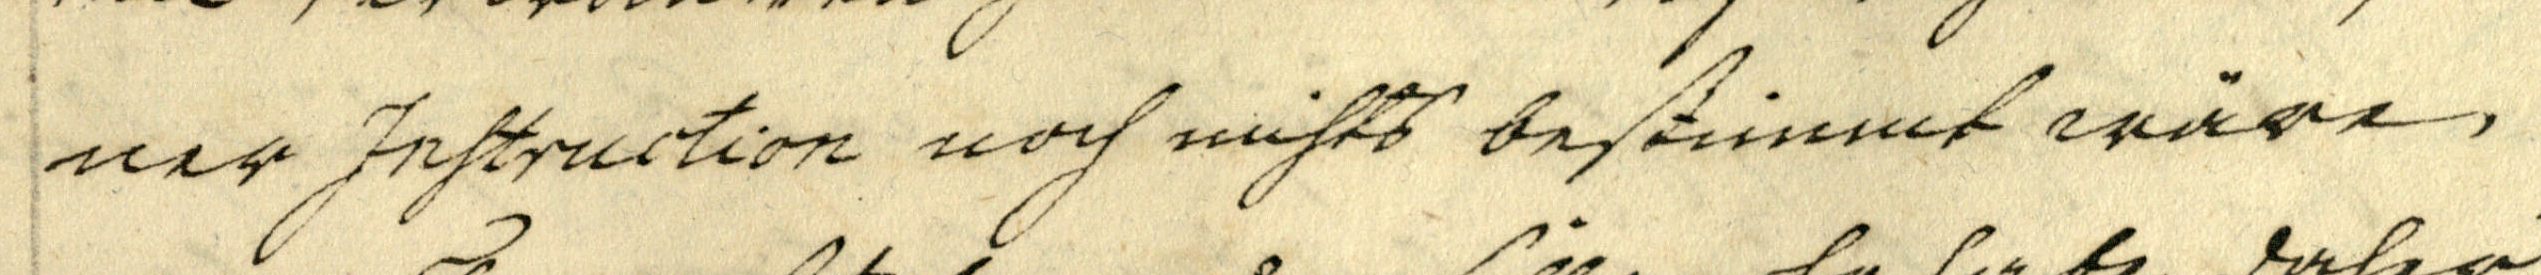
ner Instruction noch nichts bestimmt wäre,
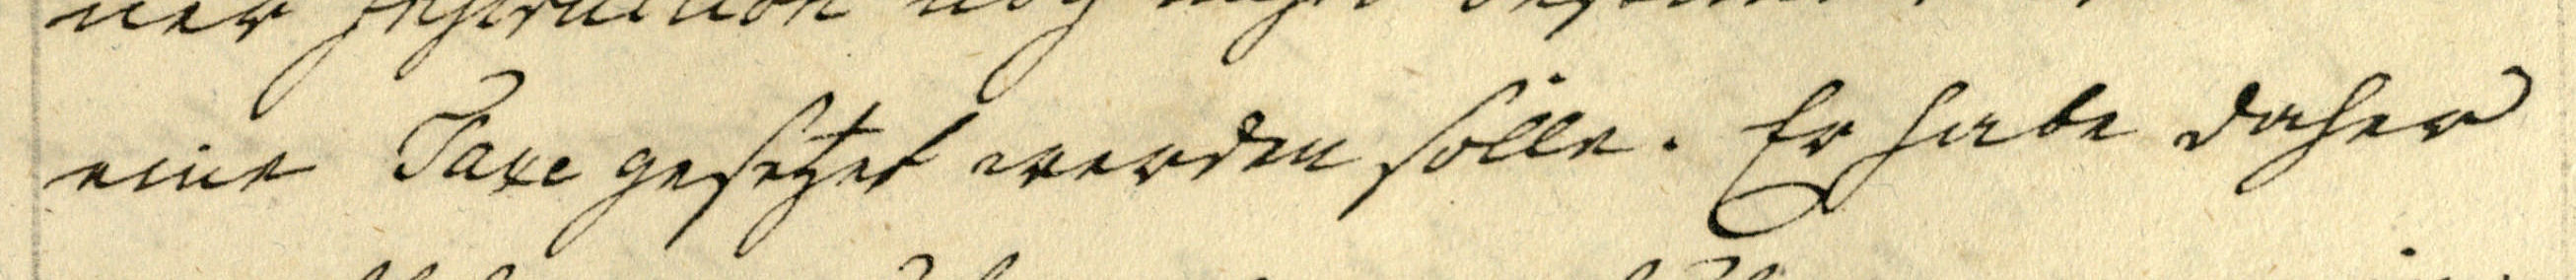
eine Taxe gesetzet werden solle. Er habe daher
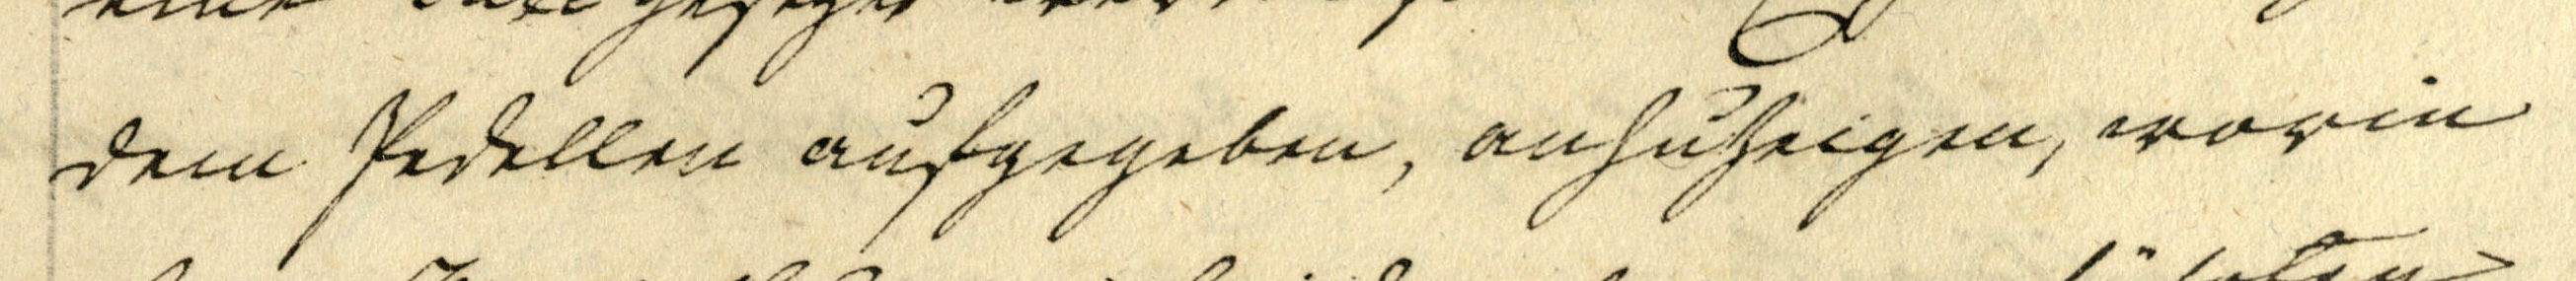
dem Pedellen aufgegeben, anzuzeigen, worin
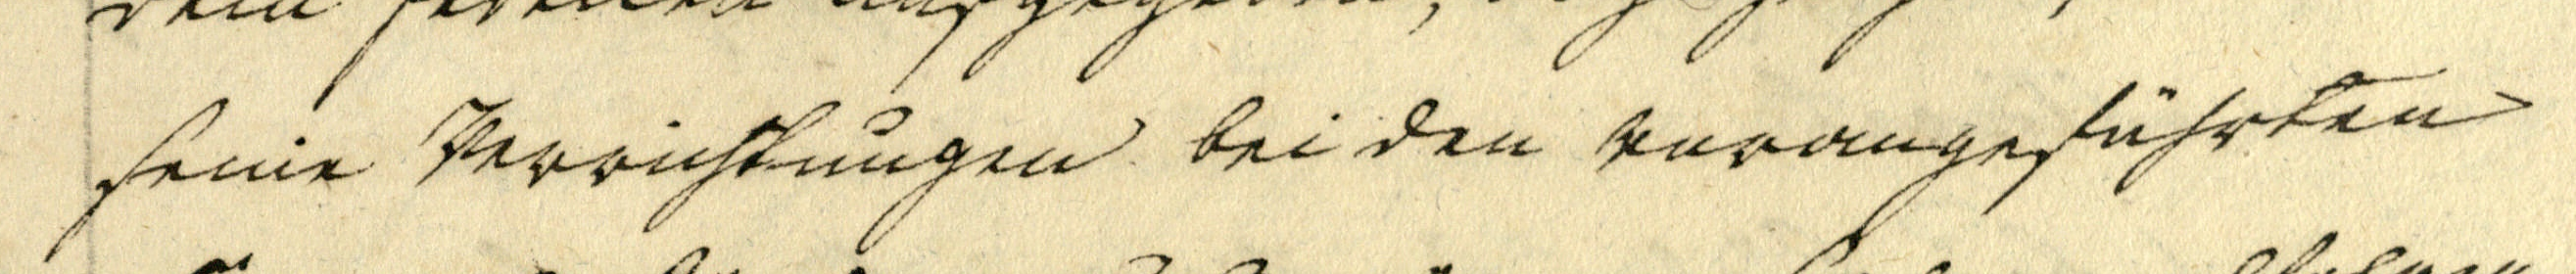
seine Verrichtungen bei den vorangeführten
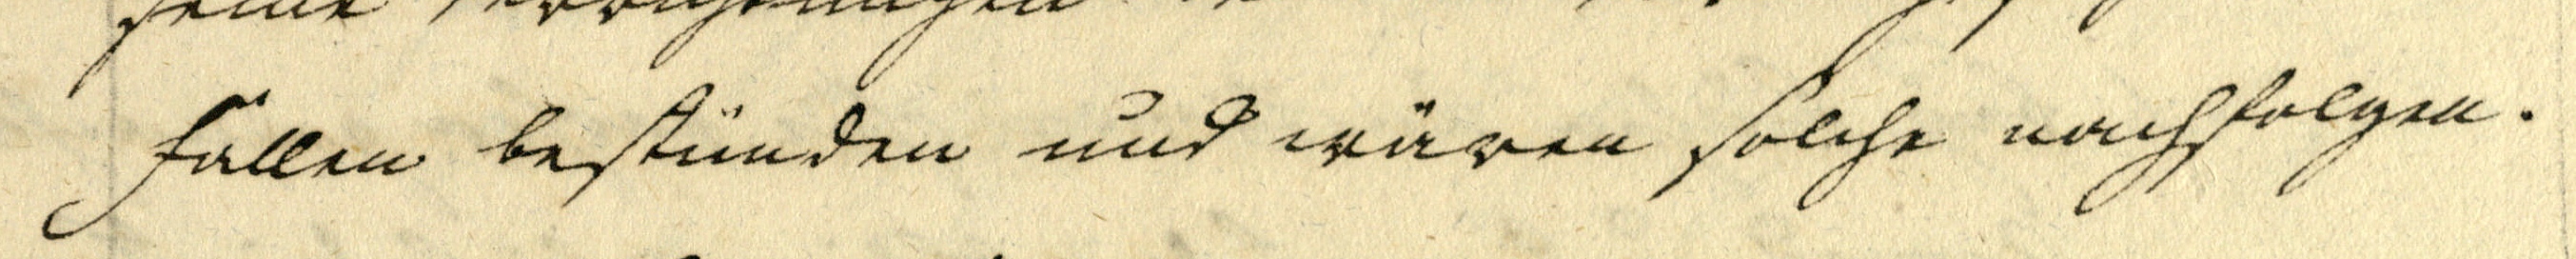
Fällen bestünden und wären solche nachfolgen¬
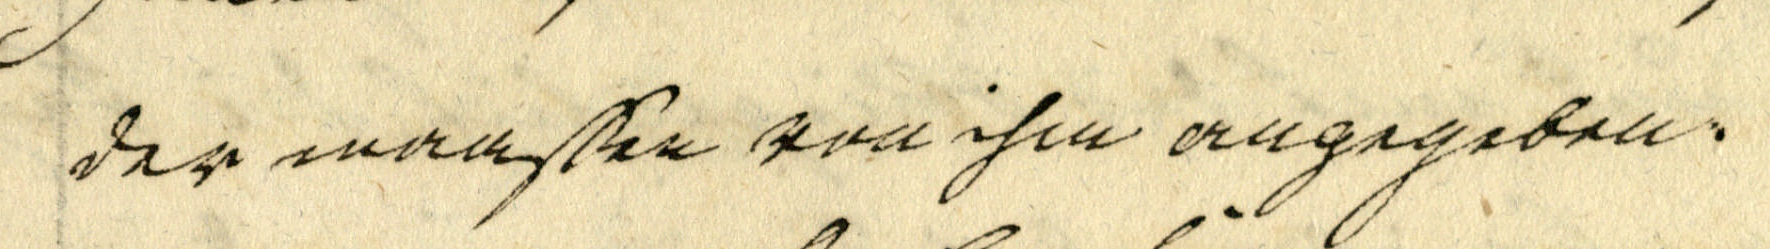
der maassen von ihm angegeben:
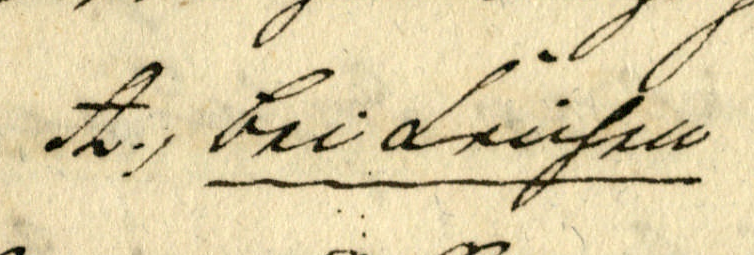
A., bei Leichen
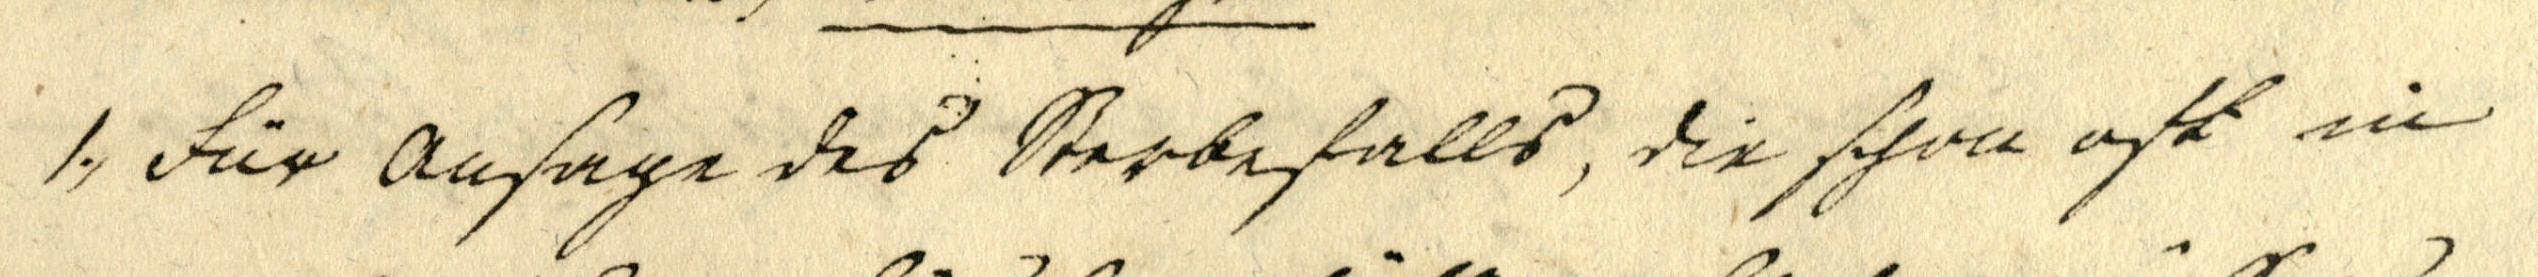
1., Für Ansage des Sterbefalls, die schon oft in
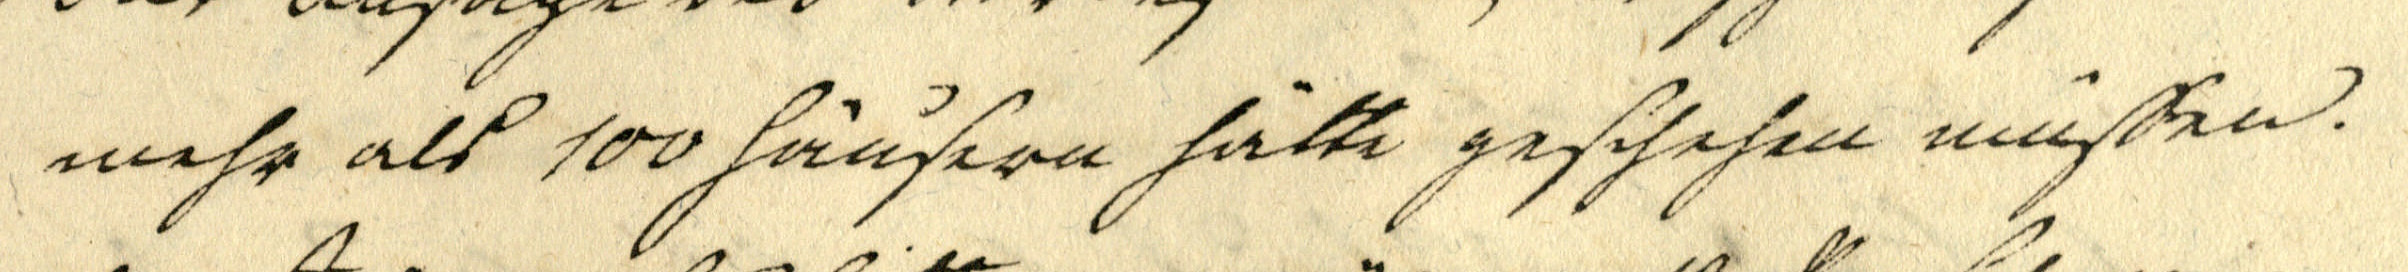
mehr als 100 Häusern hätte geschehen müssen.
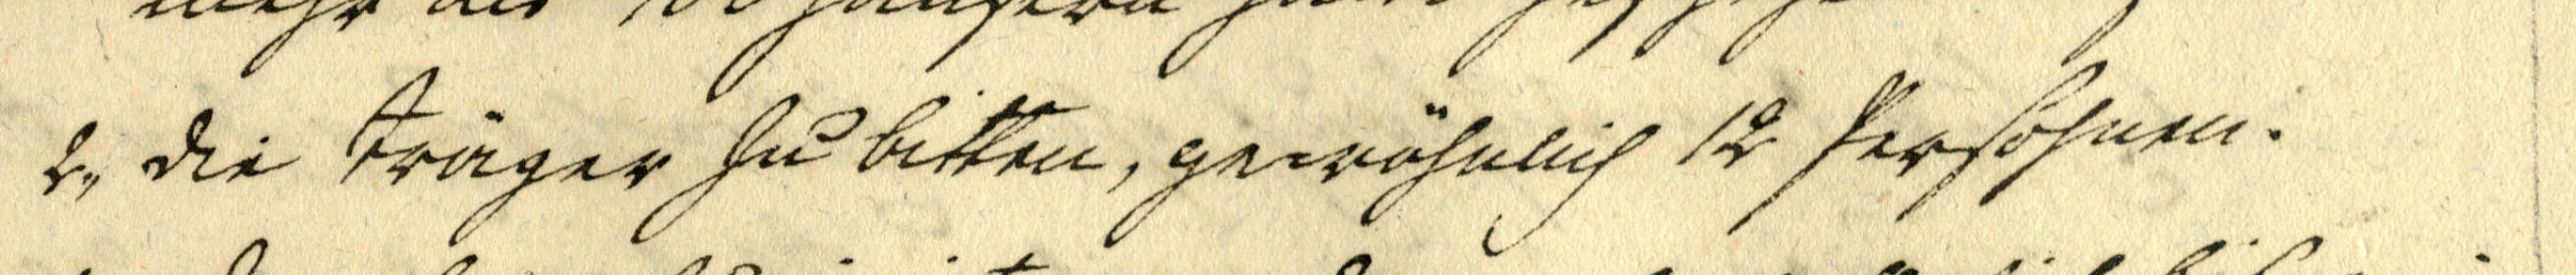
2., die Träger zu bitten, gewöhnlich 12 Persohnen.
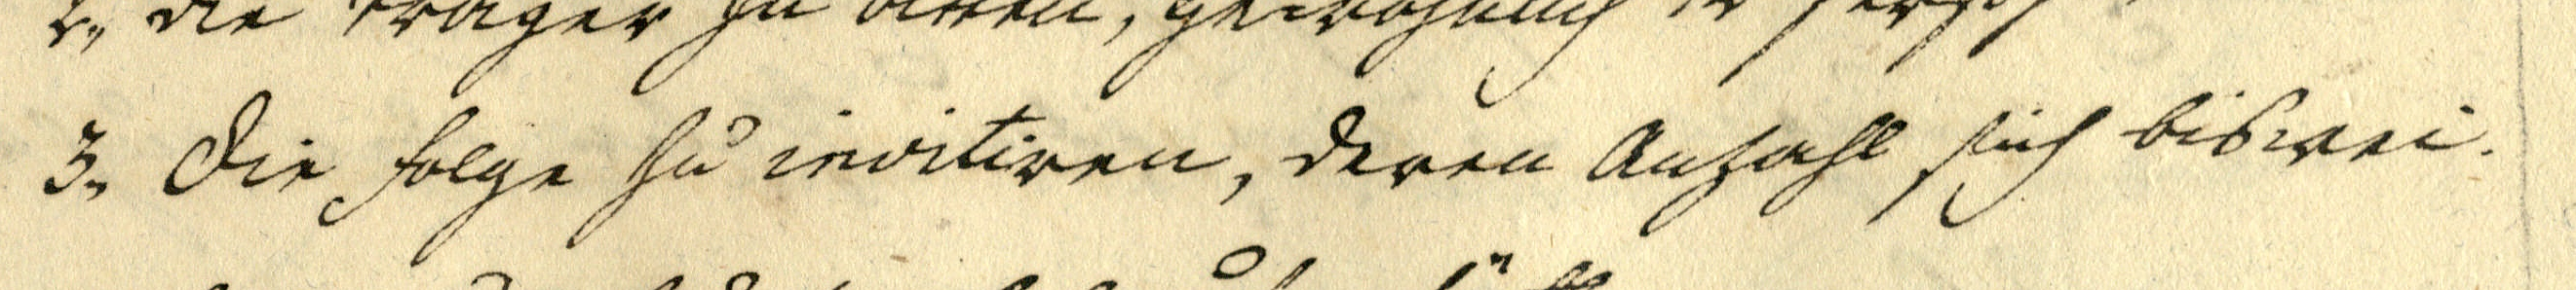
3., Die Folge zu invitiren, deren Anzahl sich biswei¬
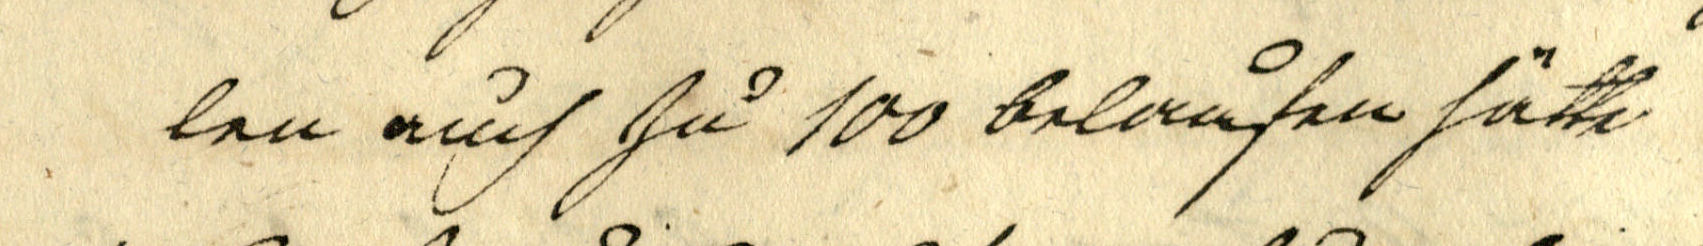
len auch zu 100 belaufen hätte
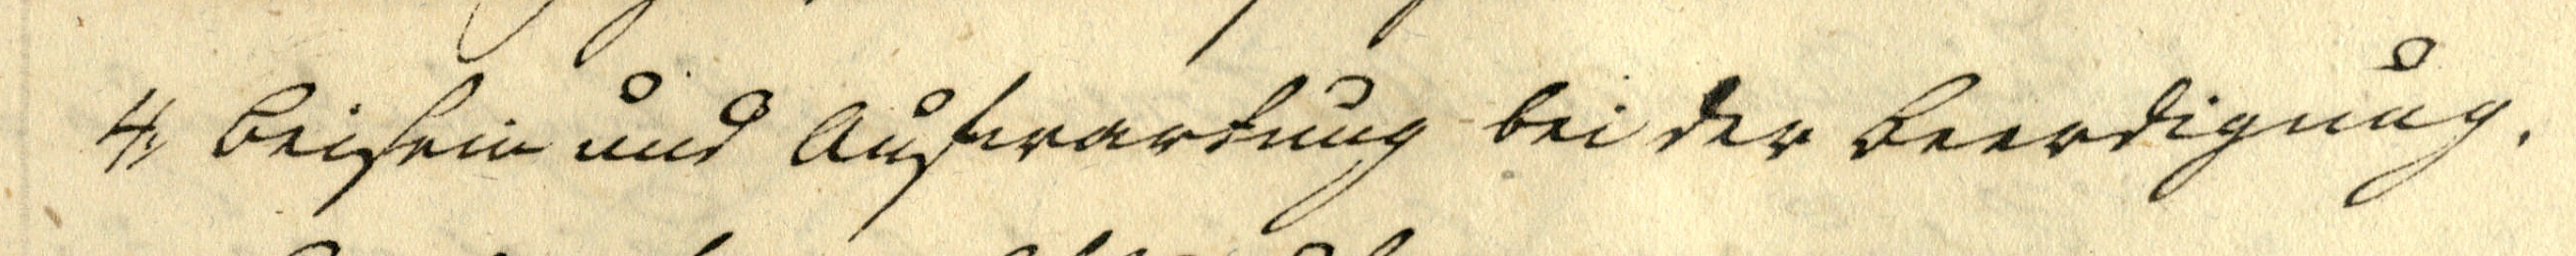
4., Beisein und Aufwartung bei der Beerdigung,
